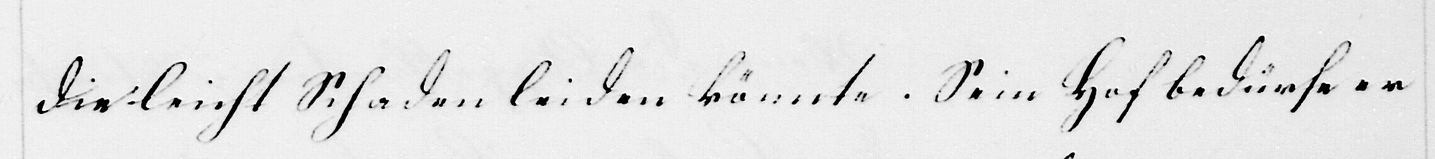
die leicht Schaden leiden könnte. Sein Hof bedürfe er
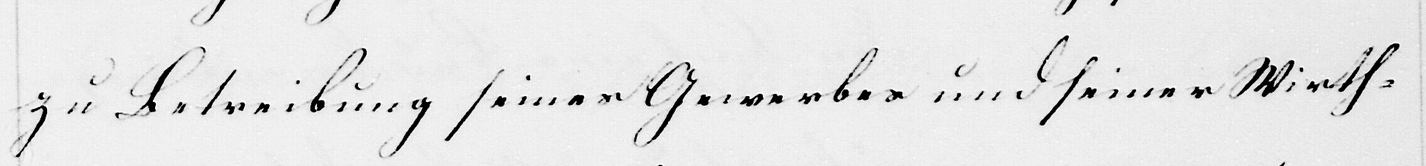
zu Betreibung seines Gewerbes und seiner Wirth¬
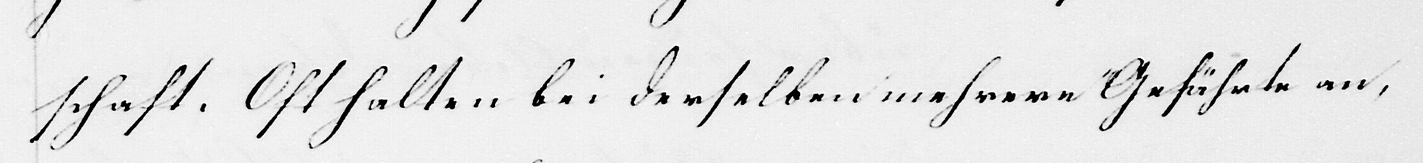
schaft. Oft halten bei derselben mehrere Gefährte an,
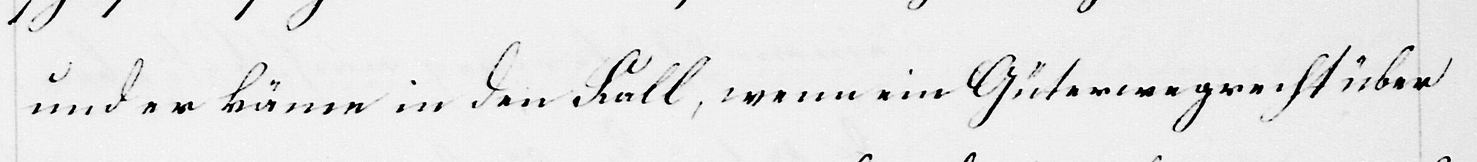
und er käme in den Fall, wenn ein Güterwegrecht über
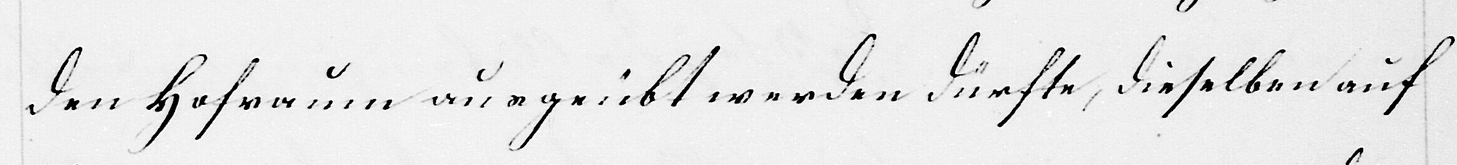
den Hofraum ausgeübt werden dürfte, dieselben auf
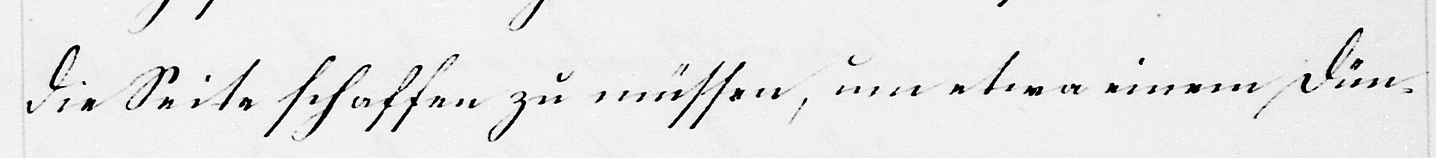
die Seite schaffen zu müssen, um etwa einem Dün¬
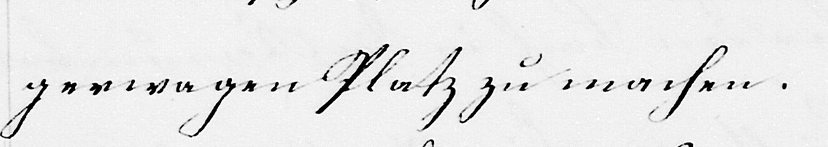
gerwagen Platz zu machen.
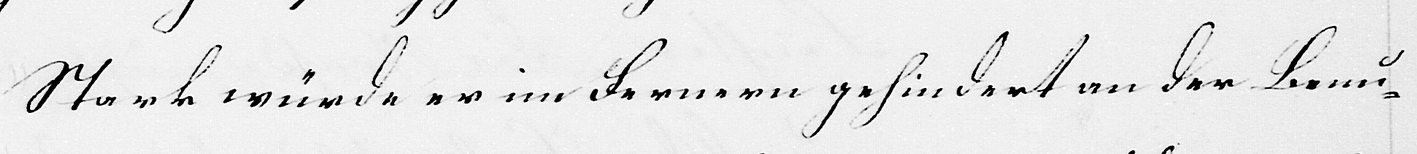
Stark würde er im Fernern gehindert an der Benu¬
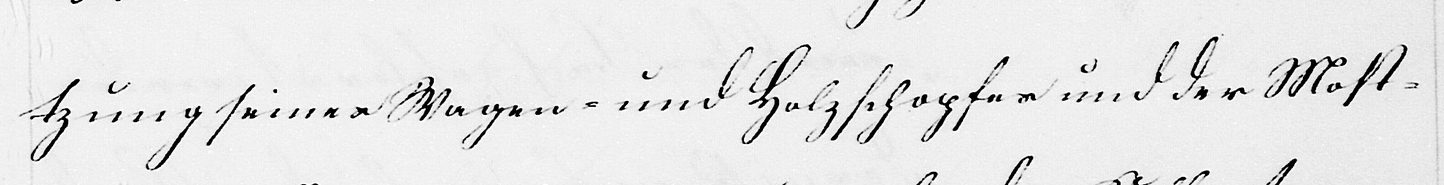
tzung seines Wagen- und Holzschopfes und der Most¬
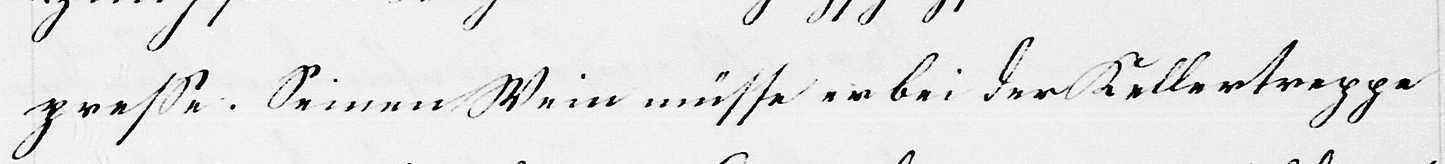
preße. Seinen Wein müsse er bei der Kellertreppe
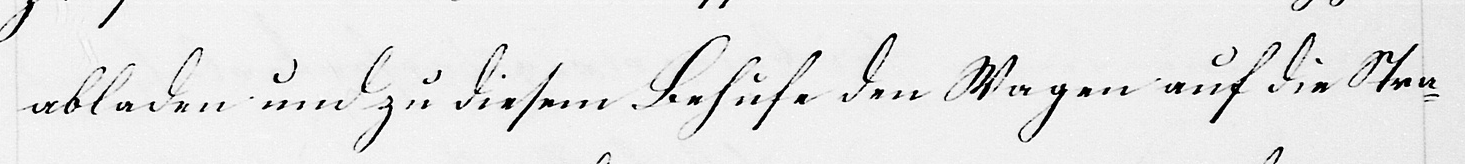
abladen und zu diesem Behufe den Wagen auf die Stra¬
